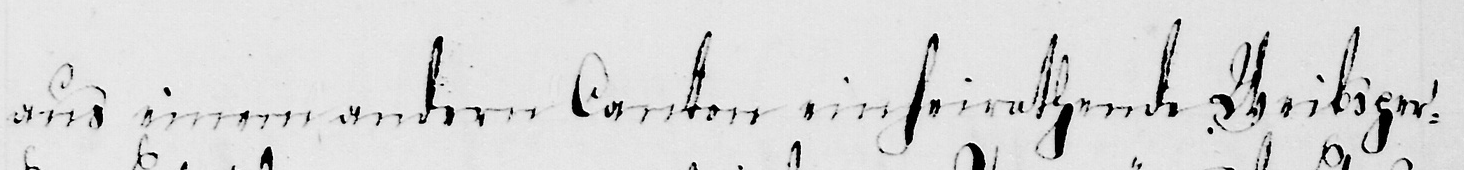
aus einem andern Canton einheirathende Weibsper¬
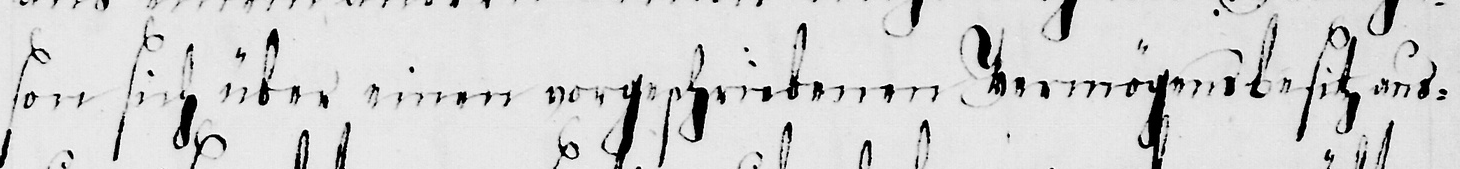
son sich über einen vorgeschriebenen Vermögensbesitz aus¬
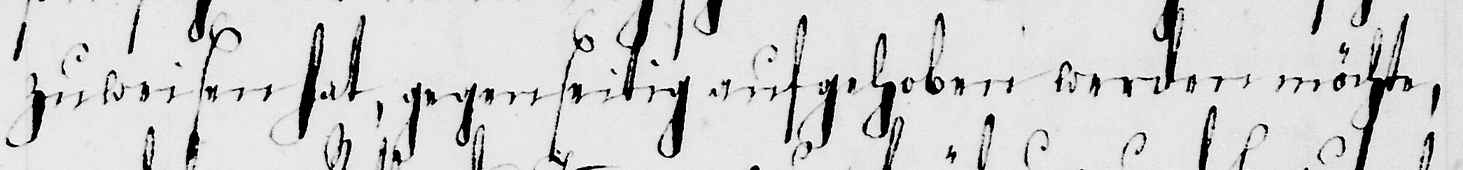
zuweisen hat, gegenseitig aufgehoben werden möchte,
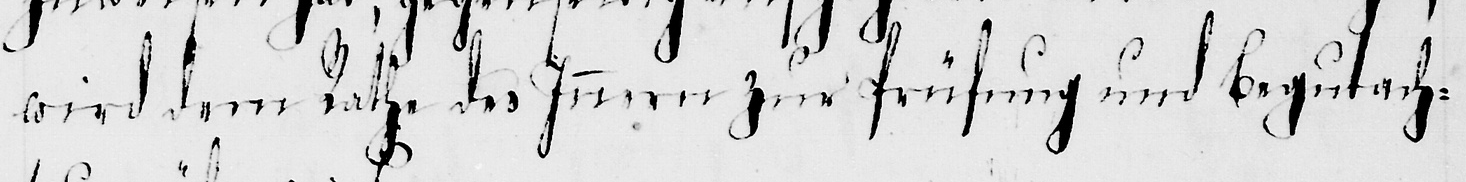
wird dem Rathe des Innern zur Prüfung und Begutach¬
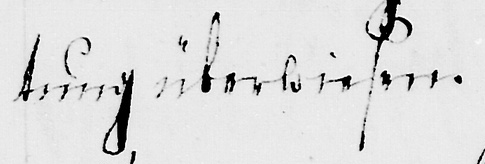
tung überwiesen.
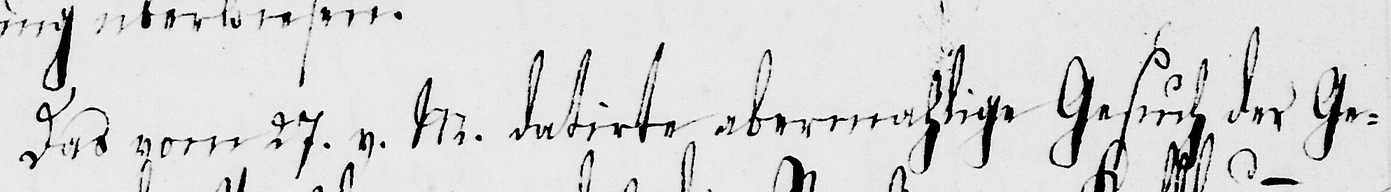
Das vom 27. v. M. datirte abermahlige Gesuch der Ge¬
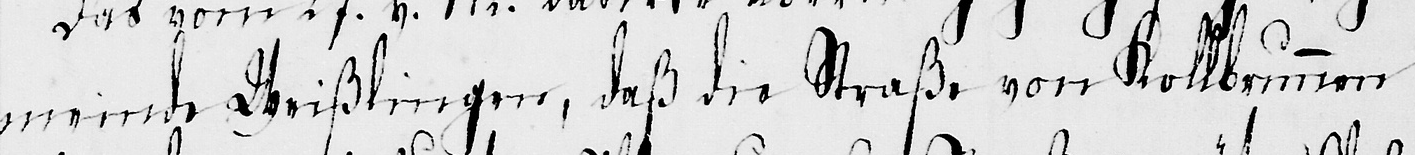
meinde Weißlingen, daß die Straße von Kollbrunnen
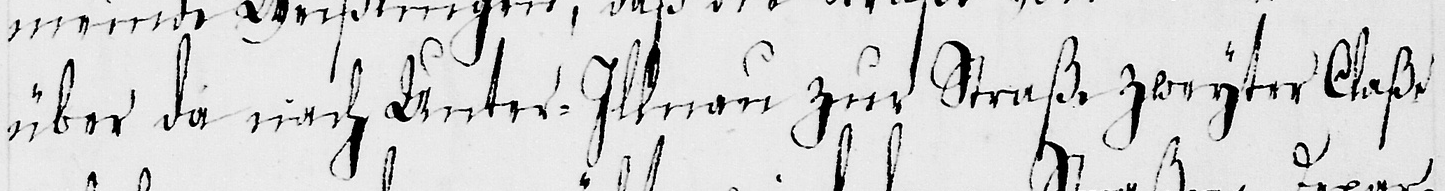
über da nach Unter-Illnau zur Straße zweyter Claße
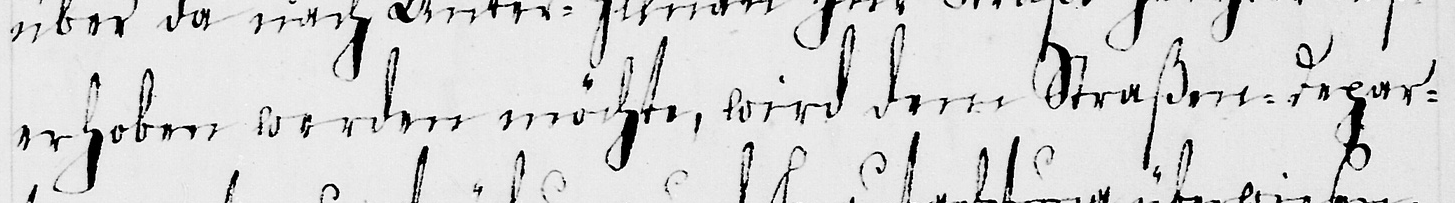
erhoben werden möchte, wird dem Straßen-Depar¬
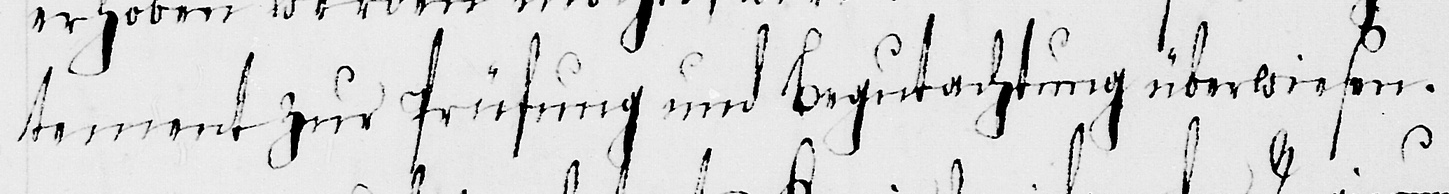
tement zur Prüfung und Begutachtung überwiesen.
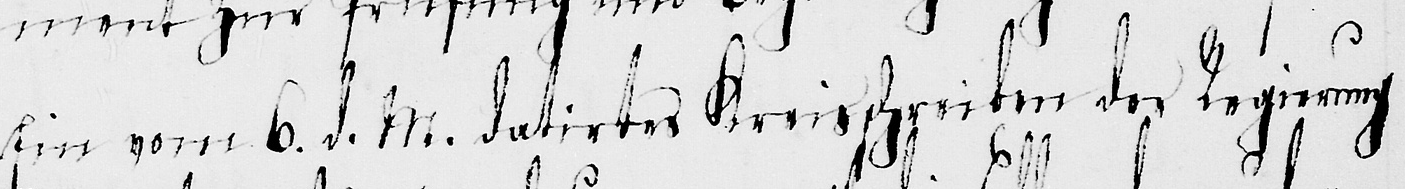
Ein vom 6. d. M. datirtes Kreisschreiben der Regierung
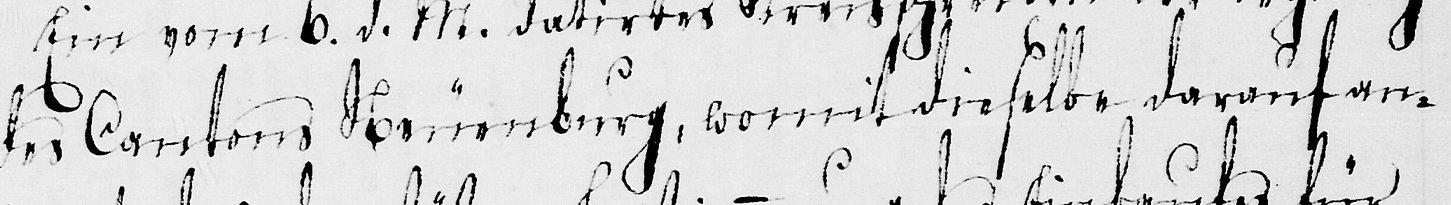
des Cantons Neuenburg, womit dieselbe darauf an¬
